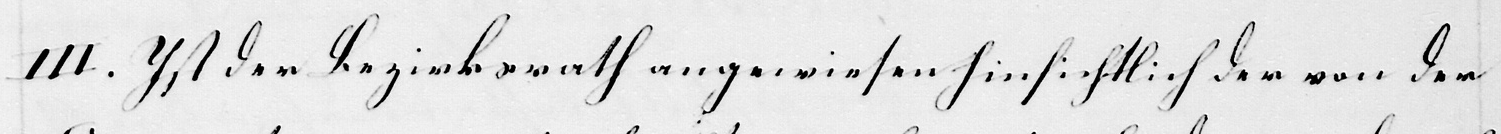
III. Ist der Bezirksrath angewiesen hinsichtlich der von der
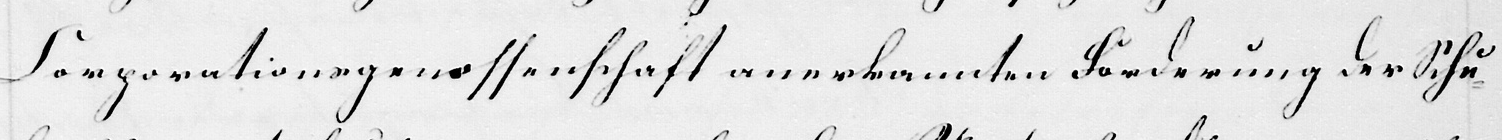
Corporationsgenossenschaft anerkannten Forderung der Schu¬
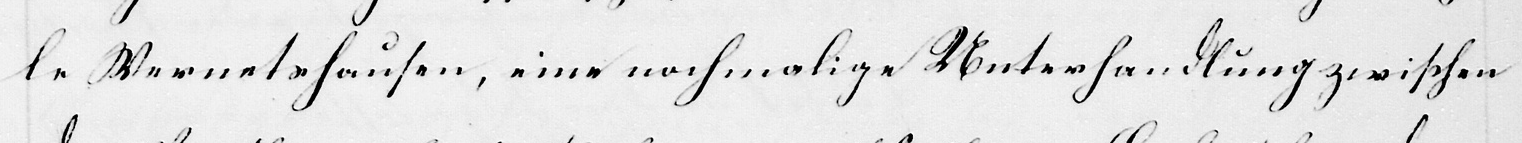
le Wernetshausen, eine nochmalige Unterhandlung zwischen
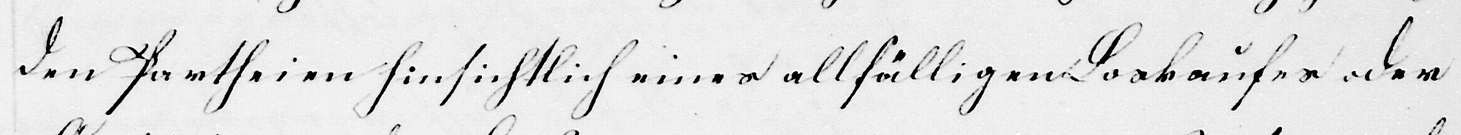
den Partheien hinsichtlich eines allfälligen Loskaufes oder
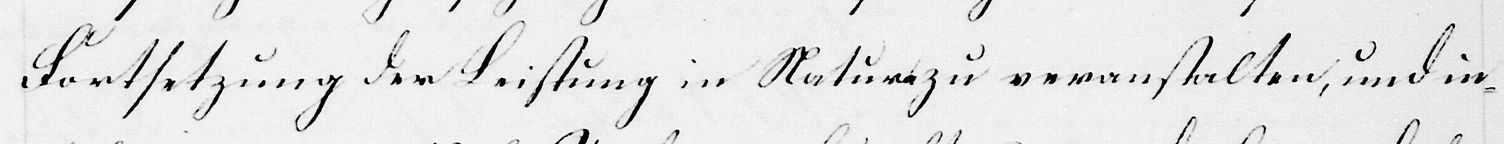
Fortsetzung der Leistung in Natura zu veranstalten, und in¬
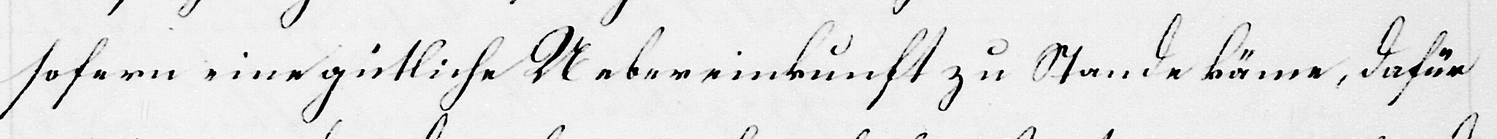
sofern eine gütliche Uebereinkunft zu Stande käme, dafür
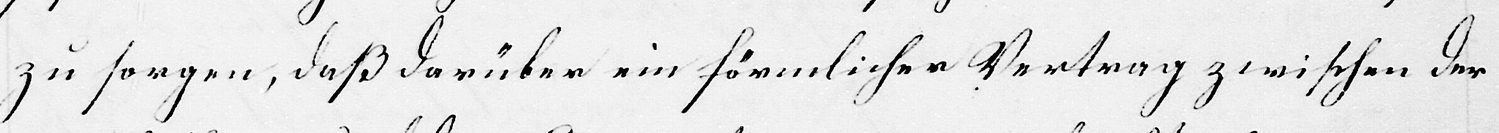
zu sorgen, daß darüber ein förmlicher Vertrag zwischen der
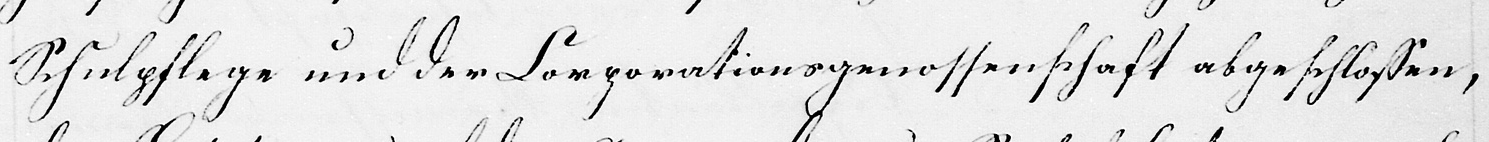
Schulpflege und der Corporationsgenossenschaft abgeschlossen,
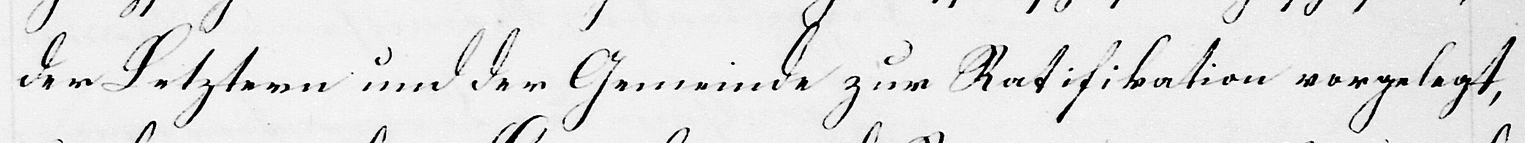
der Letztern und der Gemeinde zur Ratifikation vorgelegt,
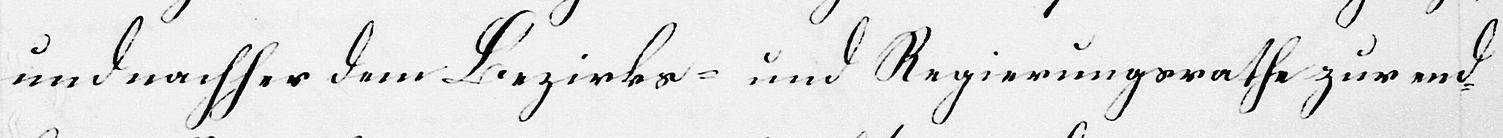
und nachher dem Bezirks- und Regierungsrathe zur end¬
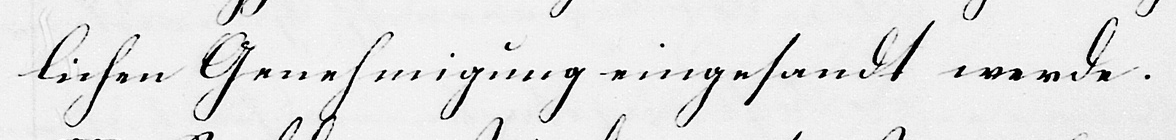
lichen Genehmigung eingesandt werde.
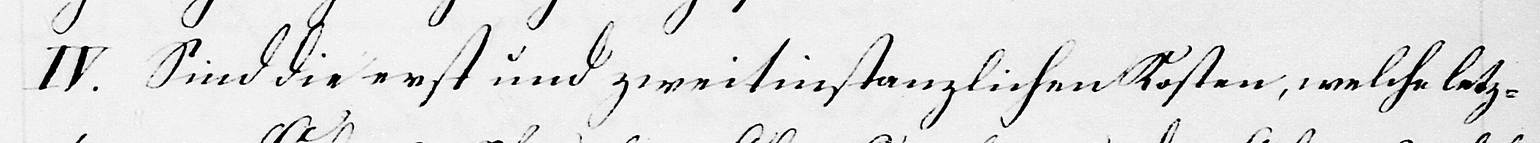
IV. Sind die erst und zweitinstanzlichen Kosten, welche letz¬
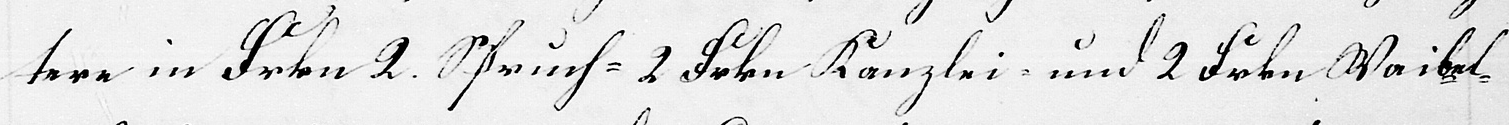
tere in Frkn 2. Spruch- 2 Frkn Kanzlei- und 2 Frkn Waibel¬
